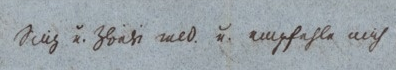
Sinz u. Zwicki med. und empfehle mich
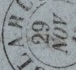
Deinen
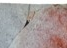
Eltern,
